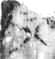凡
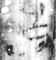冬
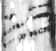三
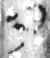月
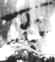壬
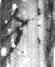癸
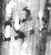甲
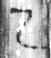乙
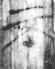不
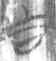吉
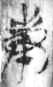庚
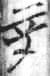辛
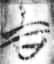吉
